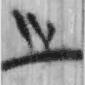之
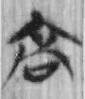高
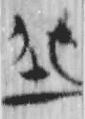丘
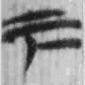下
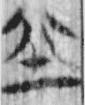丘
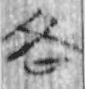各
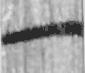一
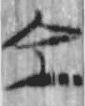全
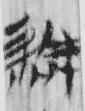豢
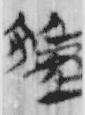○（陳）
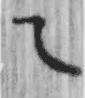乙
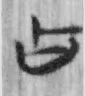占
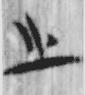之
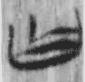曰
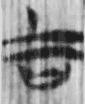吉
